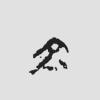{文一}
